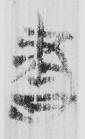晝
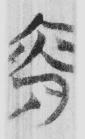夜
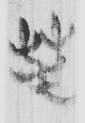芚
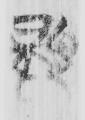{日虫頁}
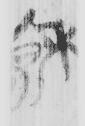{炅禾}
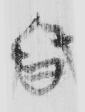冬
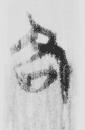各
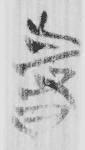時
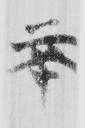不
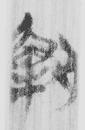解
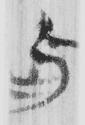此
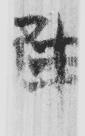隹
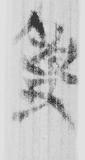事
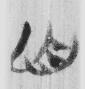首
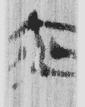亦
